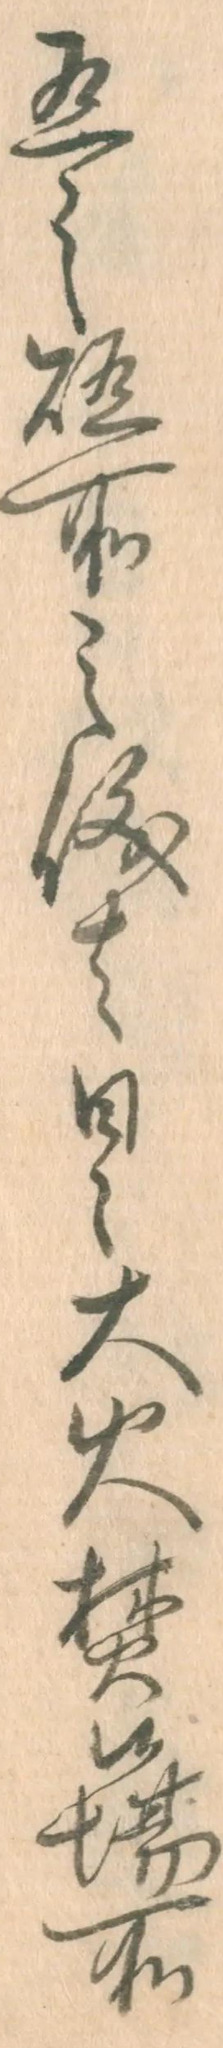有之賄所之儀は日〻大火焚候場所
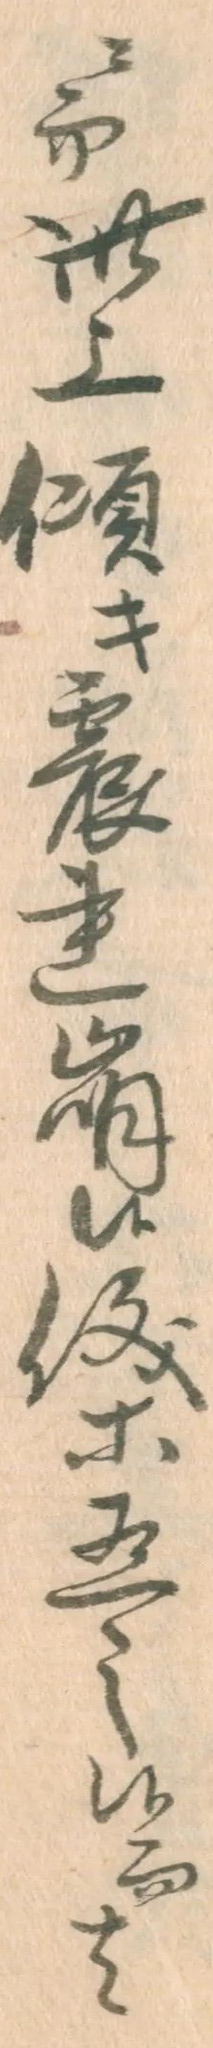ニて此上傾キ震れ崩候儀等有之候ては
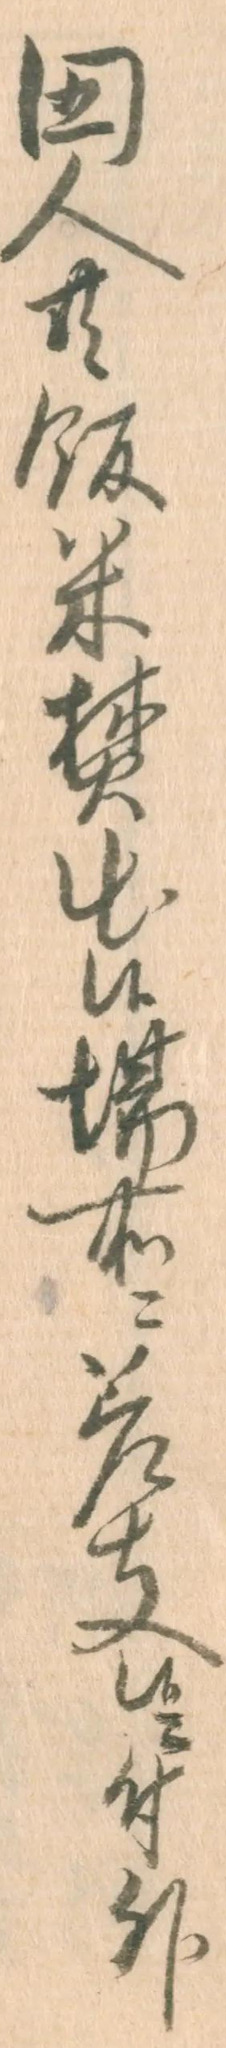囚人共飯米焚出候場所ニ差支候ニ付外
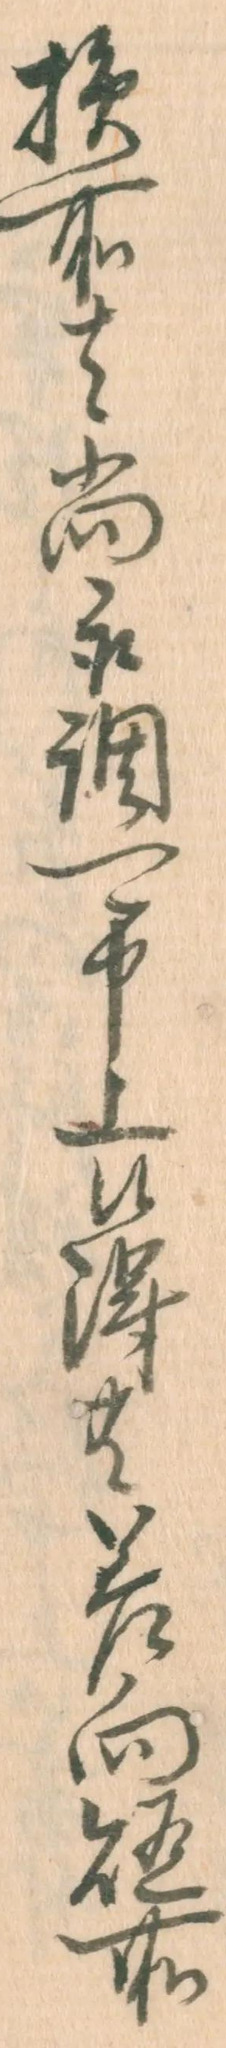損所は尚取調可申上候得共差向賄所
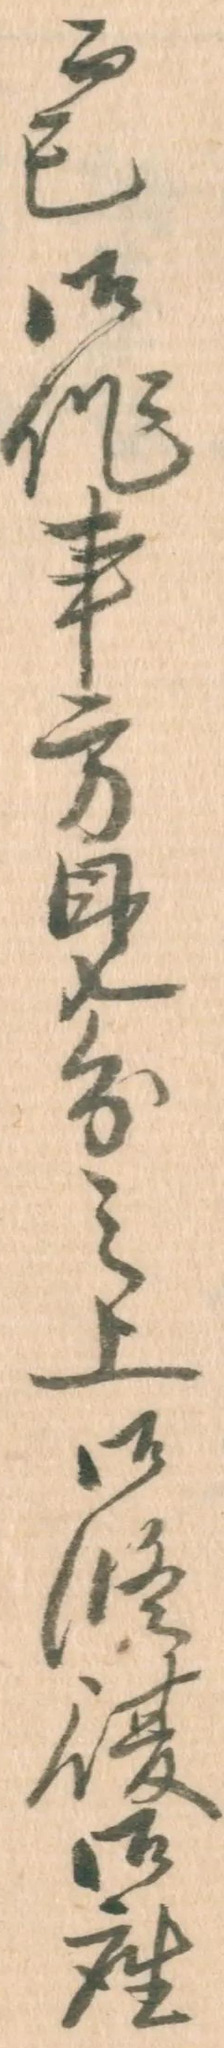而已御作事方見分之上御修復御座
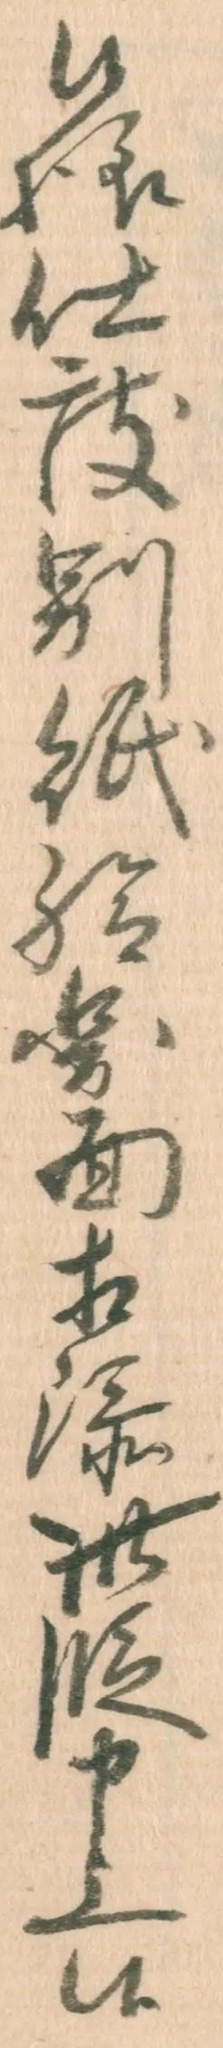候様仕度別紙絵図面相添此段申上候

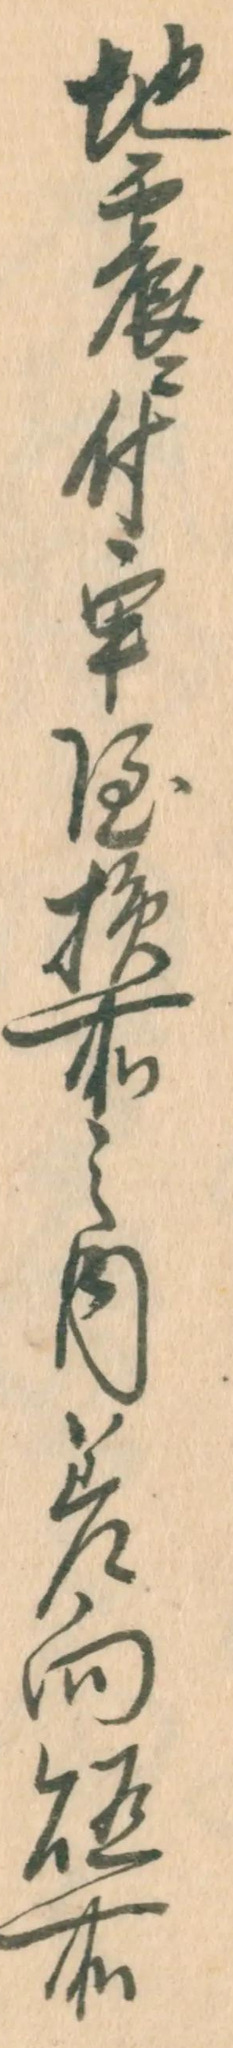地震ニ付牢屋損所之内差向賄所
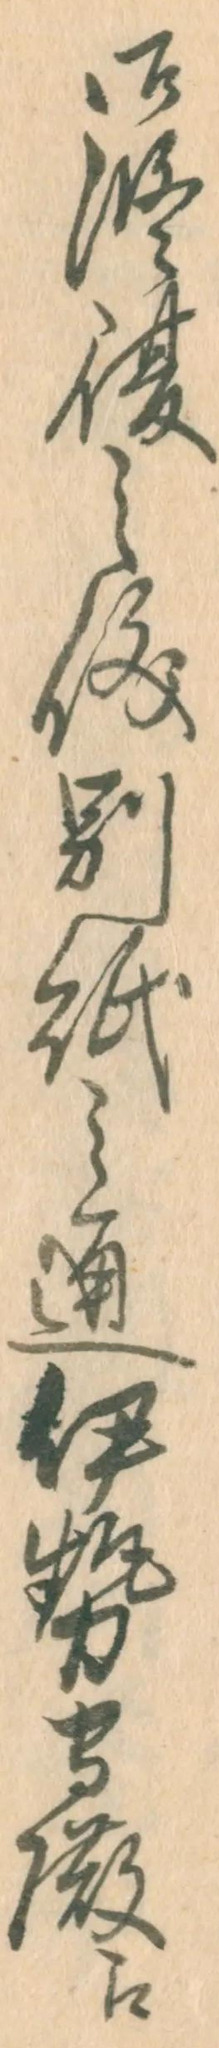御修復之儀別紙之通伊勢守殿え

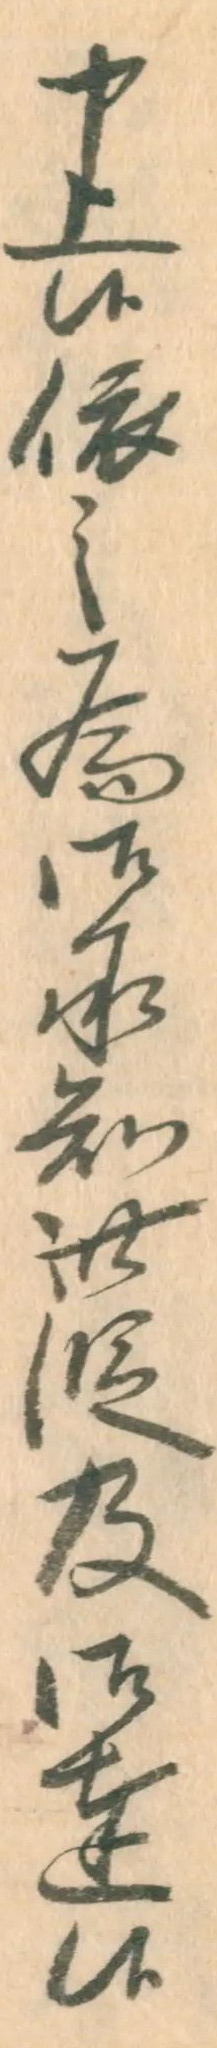申上候依之為御承知此段及御達候
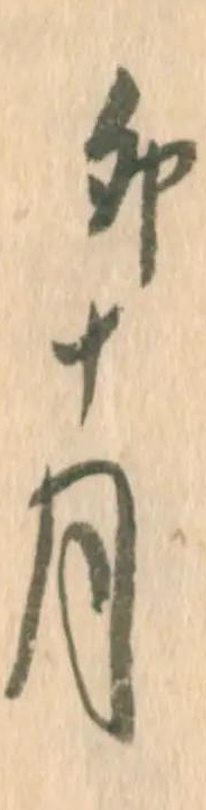卯十月

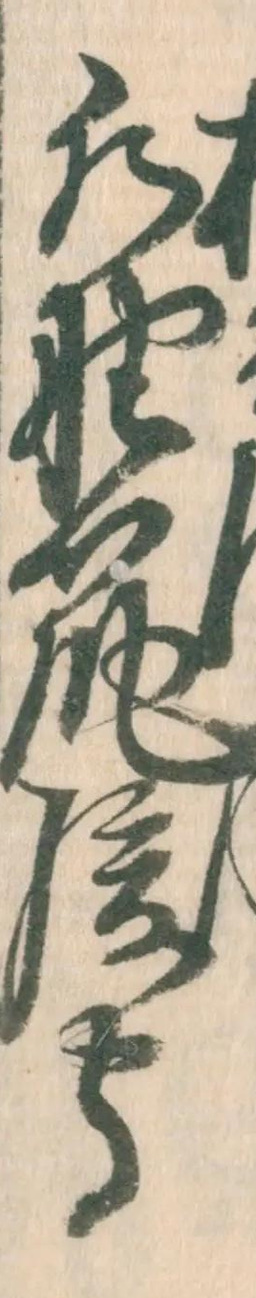│水野筑後守
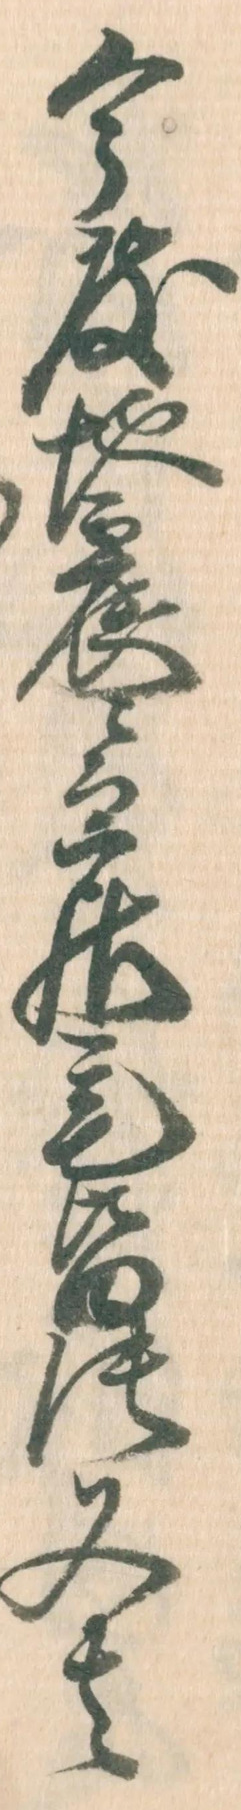今度地震ニて居宅皆潰又は
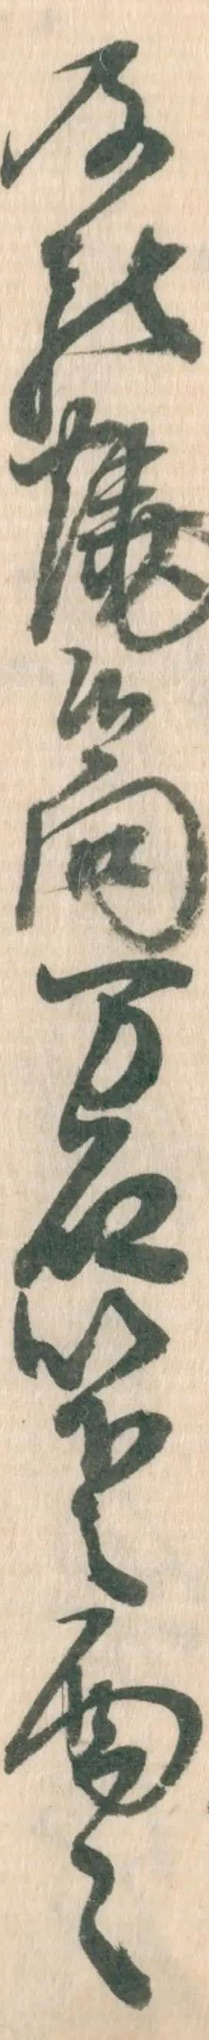及類焼候向万石以下之面〻
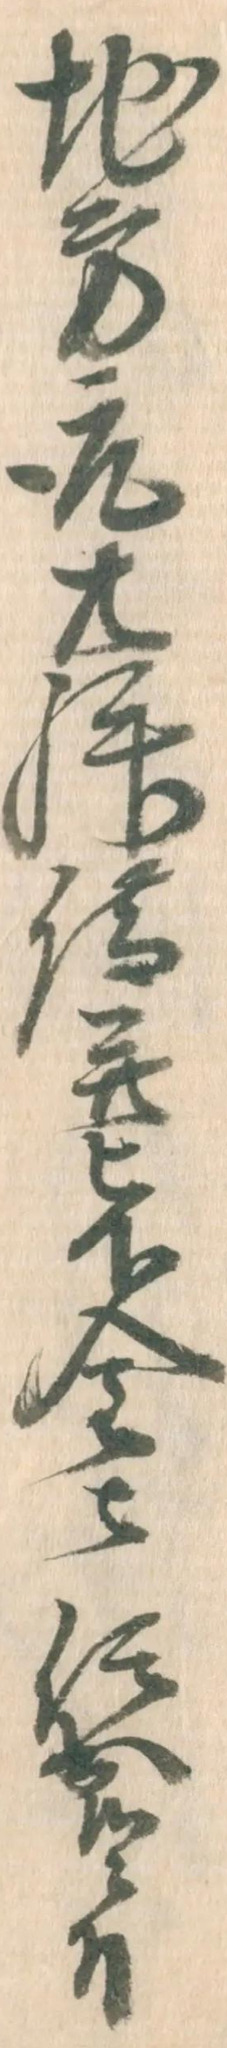地方取共拝借幷被下金被仰出候ニ付

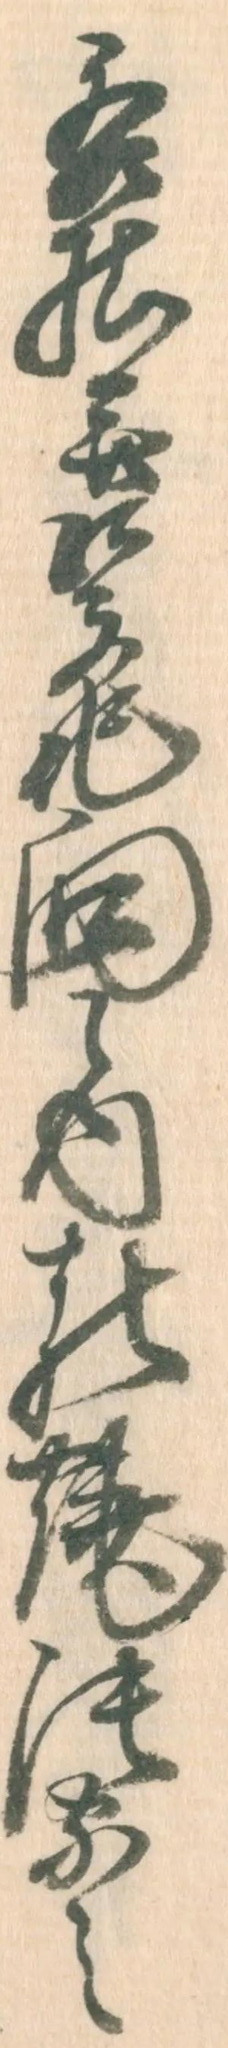各様幷支配向之内類焼潰家之
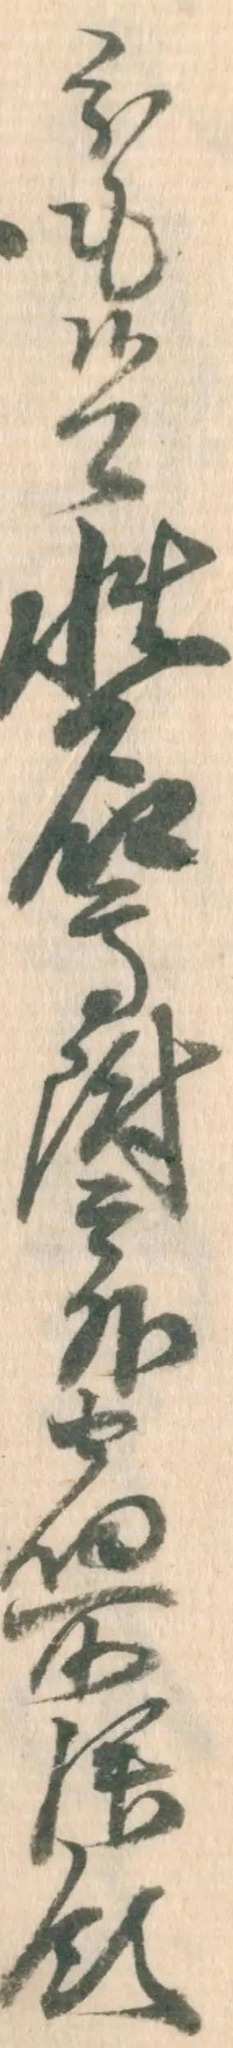分も候ハヽ姓名高附其外宿所拝領
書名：地震災書留 2巻. [2] 内表紙に「地震一件　安政二卯年十月」とあり
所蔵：国立国会図書館 National Diet Library, JAPAN
